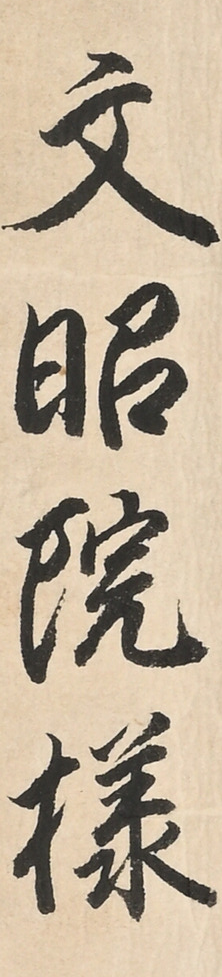文昭院様
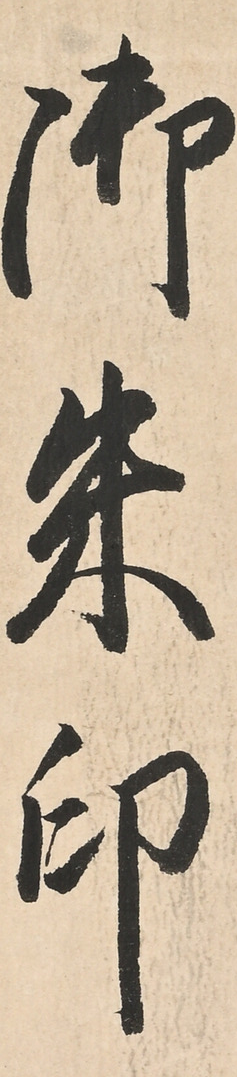御朱印
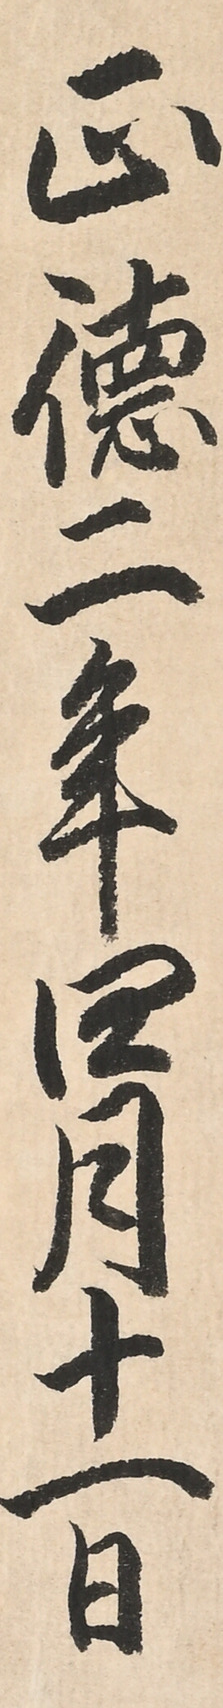正徳二年四月十一日

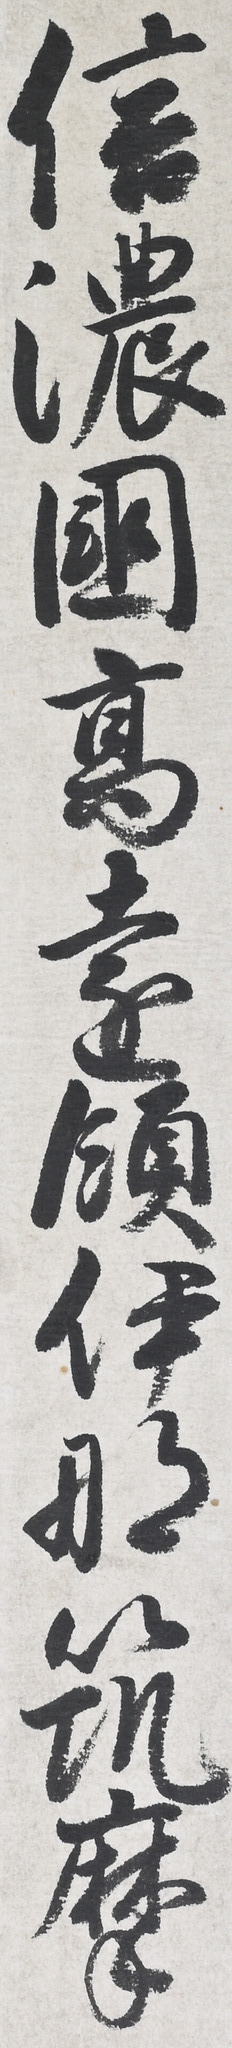信濃国高遠領伊那筑摩
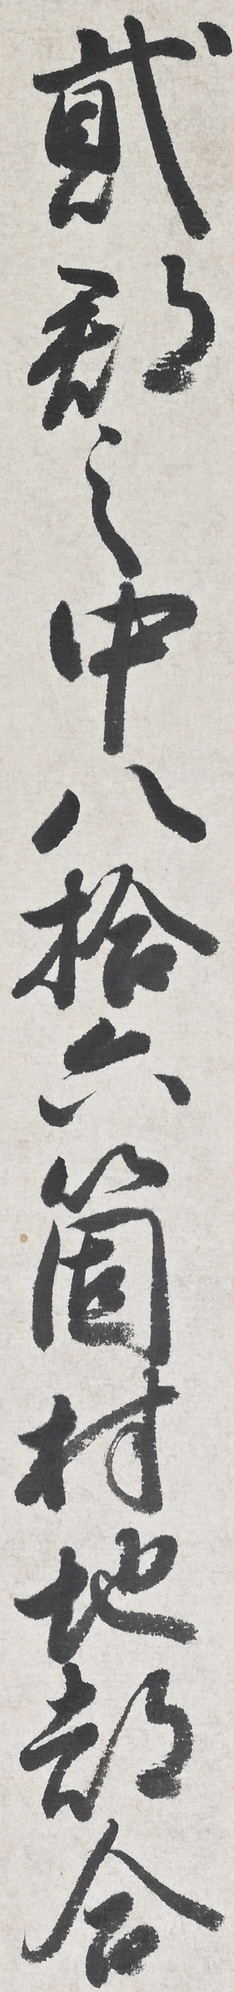弐郡之中八拾六箇村地都合
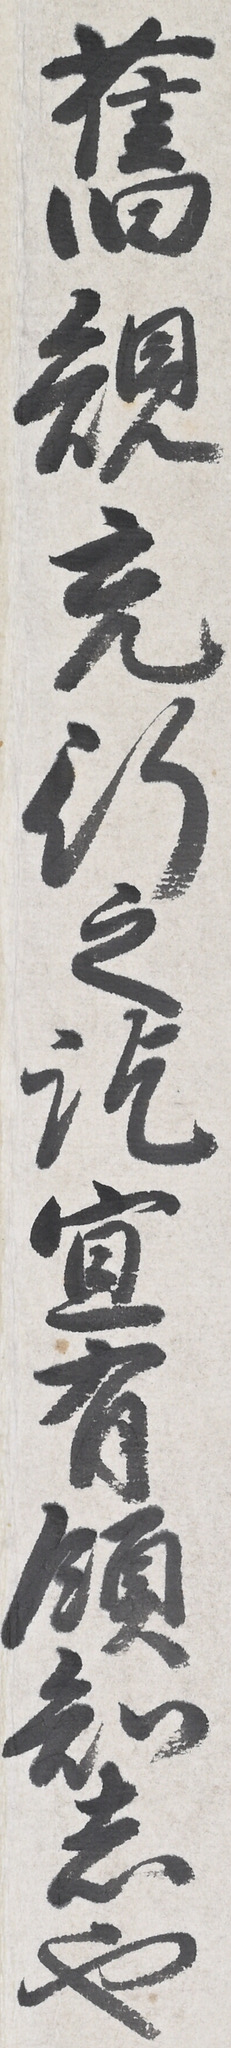旧規充行之訖宜有領地者也
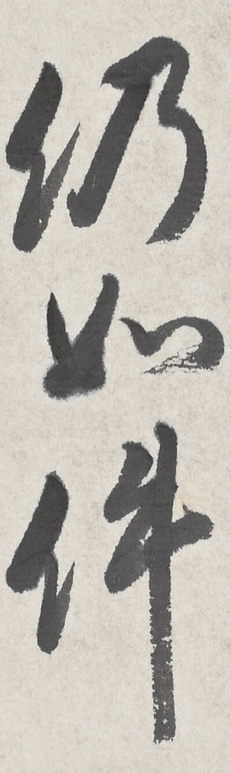仍如件
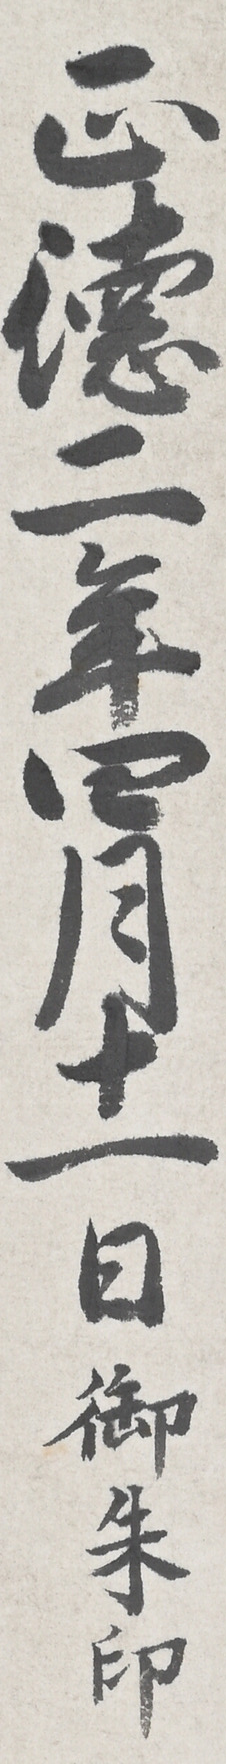正徳二年四月十一日御朱印
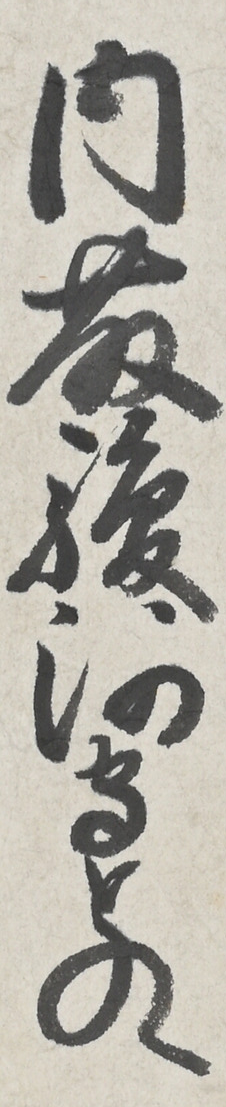内藤駿河守とのへ
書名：御朱印状・写
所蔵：伊那市立高遠町図書館・合同会社AMANE
